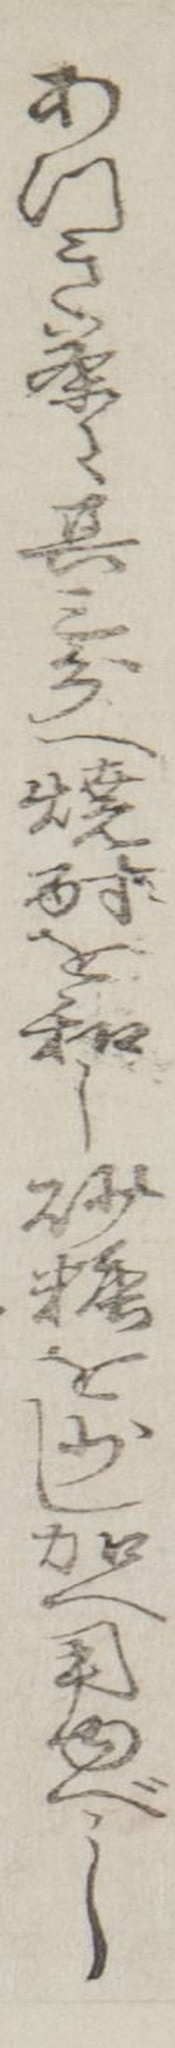あつき茶に其三分へ焼酎を和し砂糖を少し加へ用ゆべし
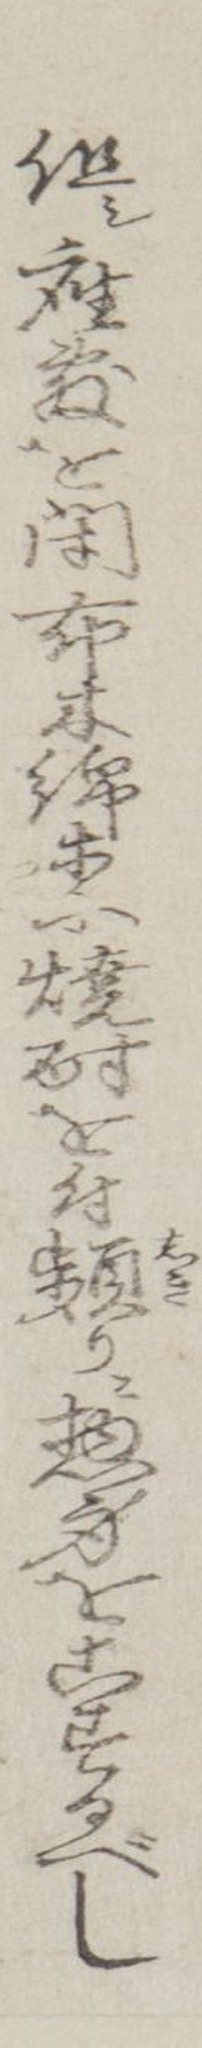但し座敷を閉布木綿等に焼酎を付頻りに惣身をこするべし
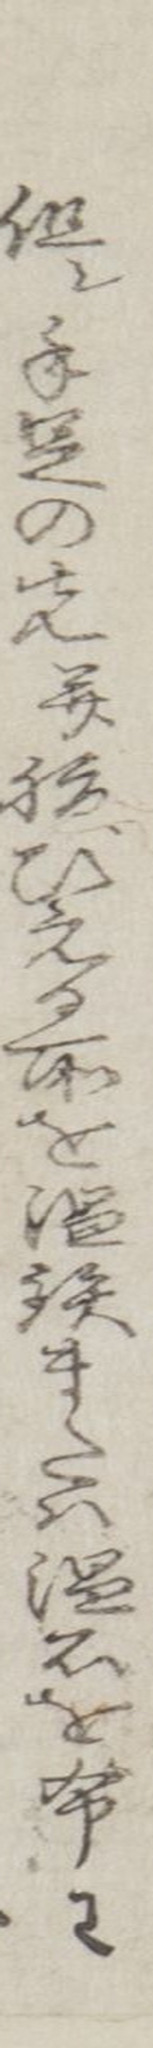但し手足の先并腹ひえる所を温鉄または温石を布に
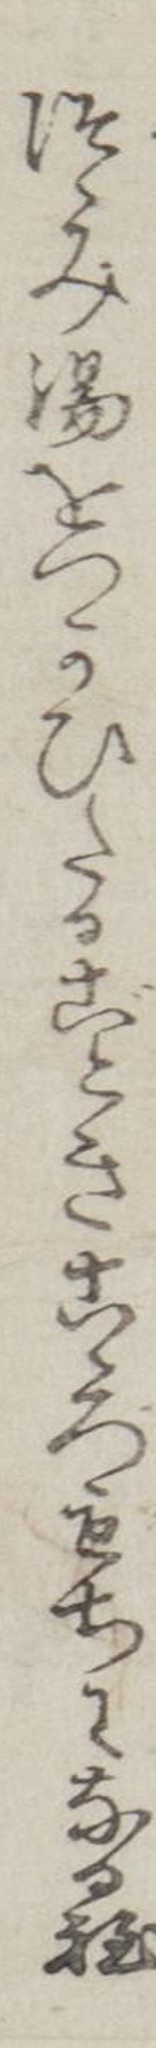つゝみ湯をつかひたるごときこゝろもちになる程
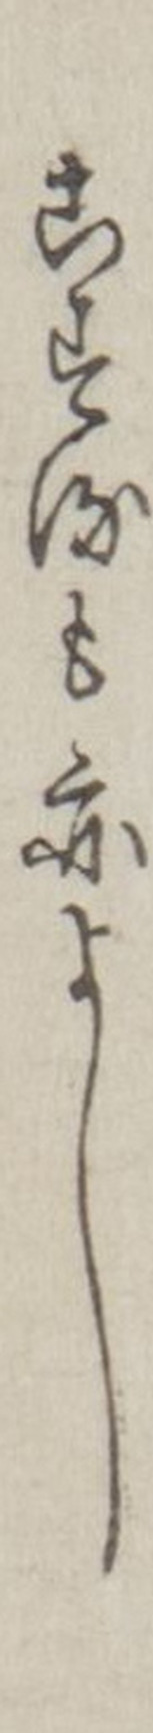こするも亦よし
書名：流行暴瀉病療治方
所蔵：あいおいニッセイ同和損保株式会社
